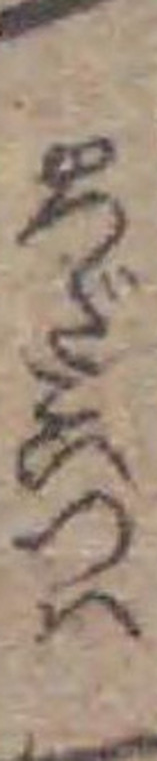やつだこいつは
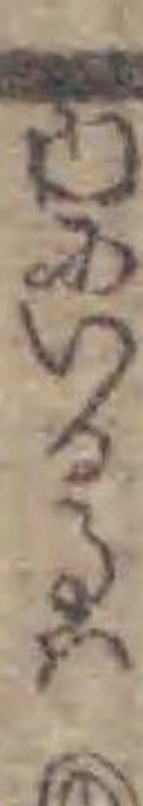内にいる事は
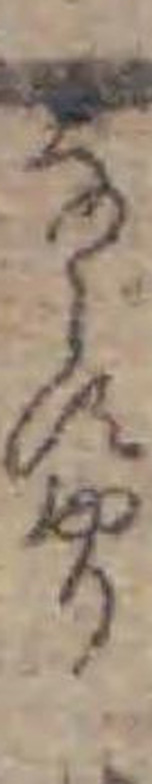ならすおり
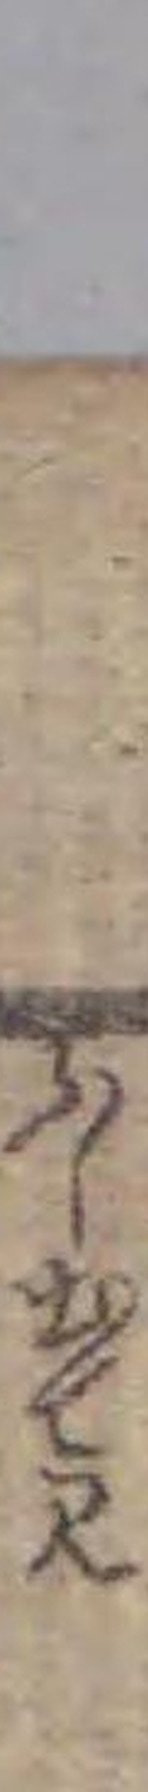ふし出て見
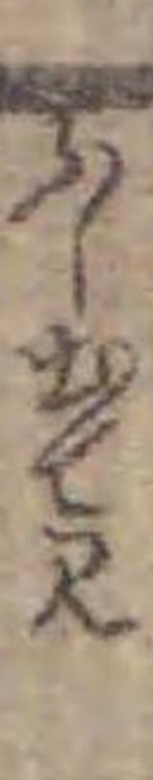ふし出て見
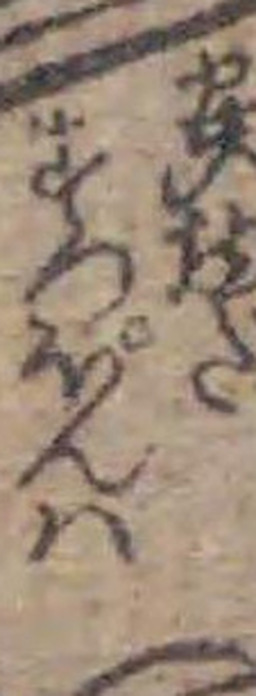すつぽんは
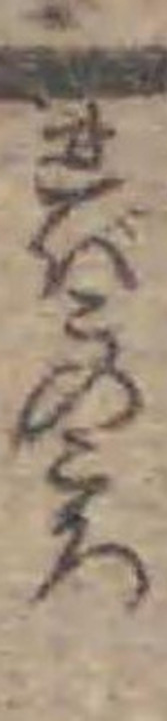ればこのころ
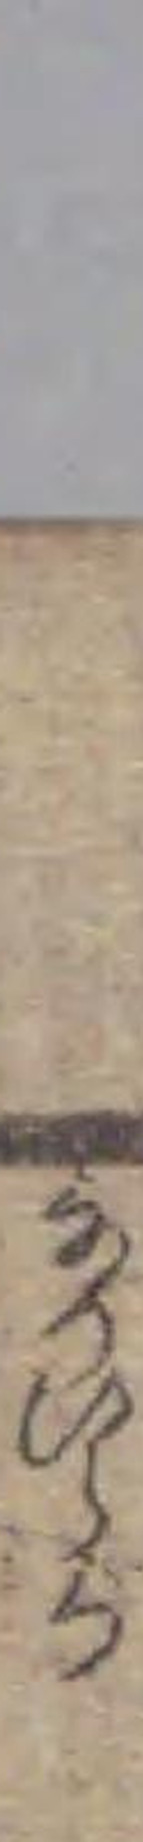なりひらが
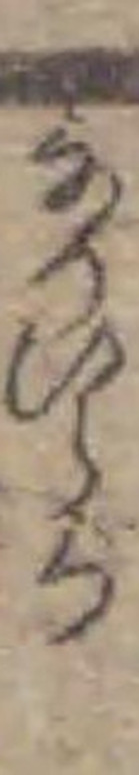なりひらが
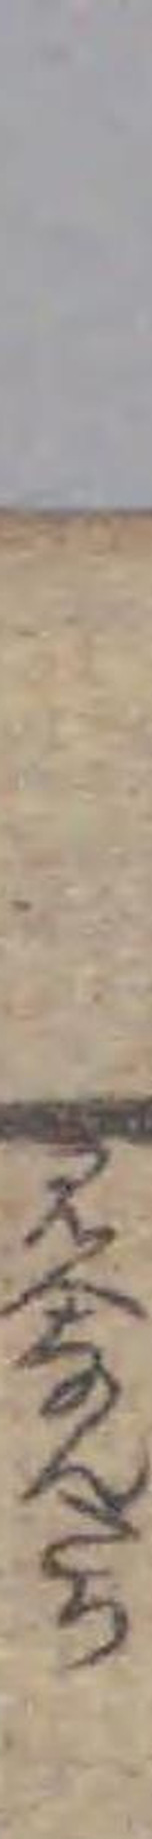見へなんたか
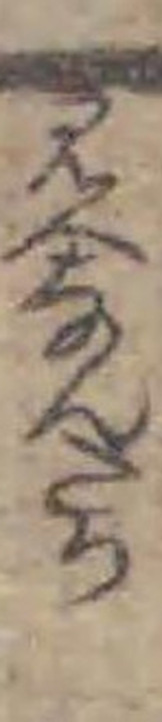見へなんたか
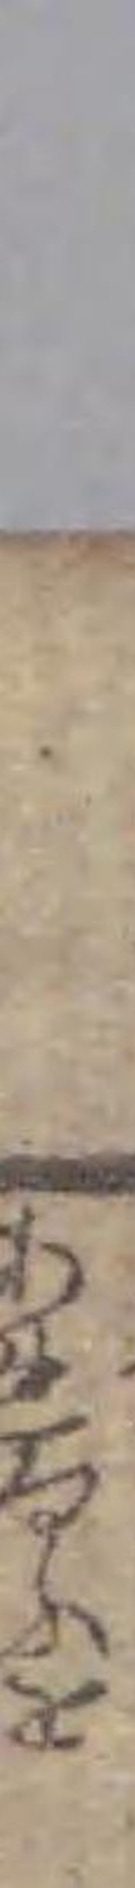あれ向ふを
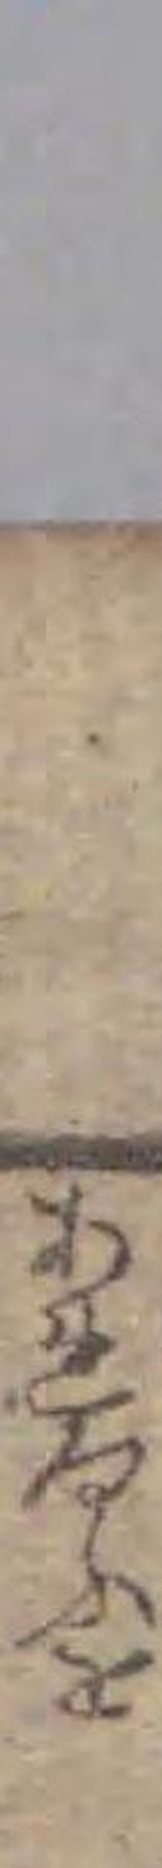あれ向ふを
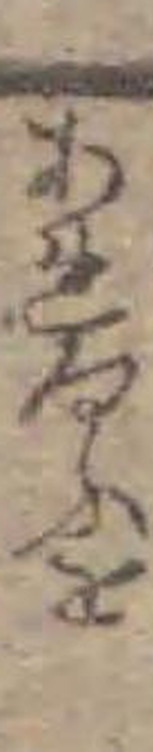あれ向ふを
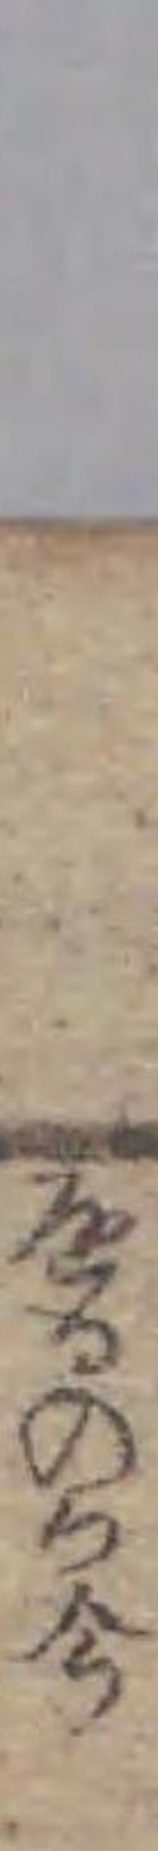通るのか今
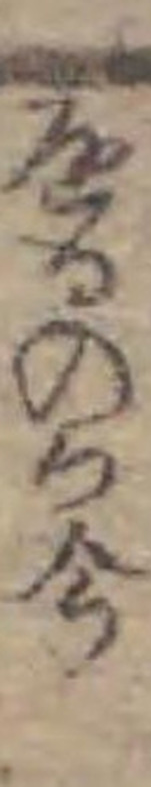通るのか今
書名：通風伊勢物語 : 3巻
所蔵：国立国会図書館 National Diet Library, JAPAN
